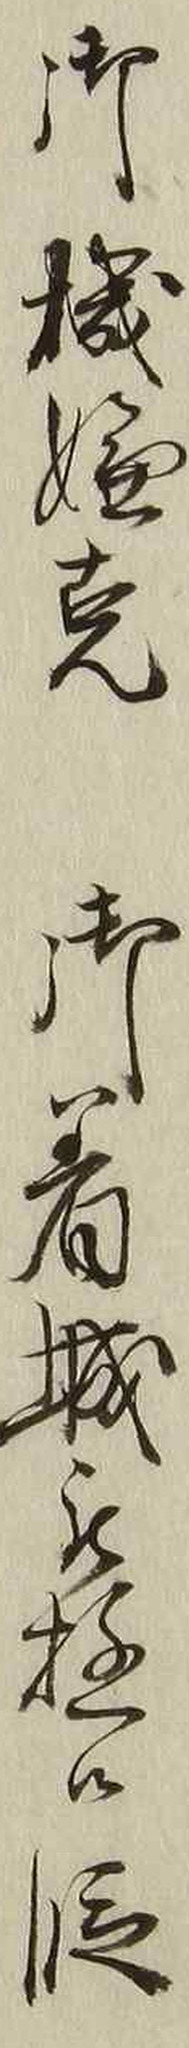御機嫌克御着城被遊候段
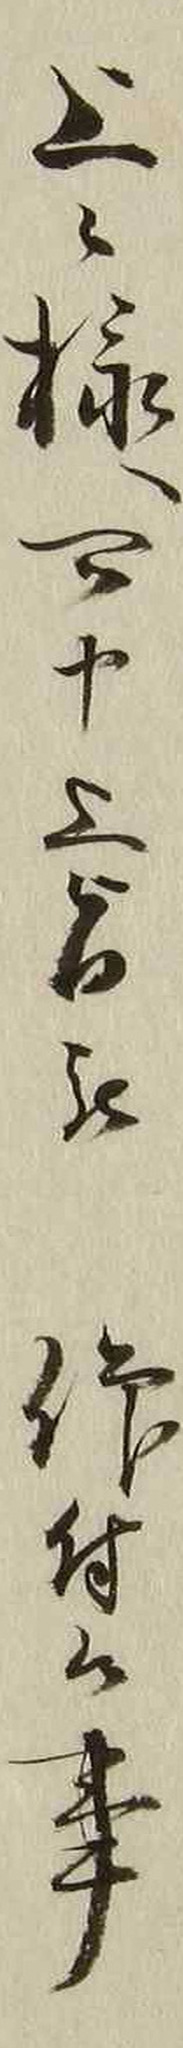上々様へ可申上旨被仰付候事
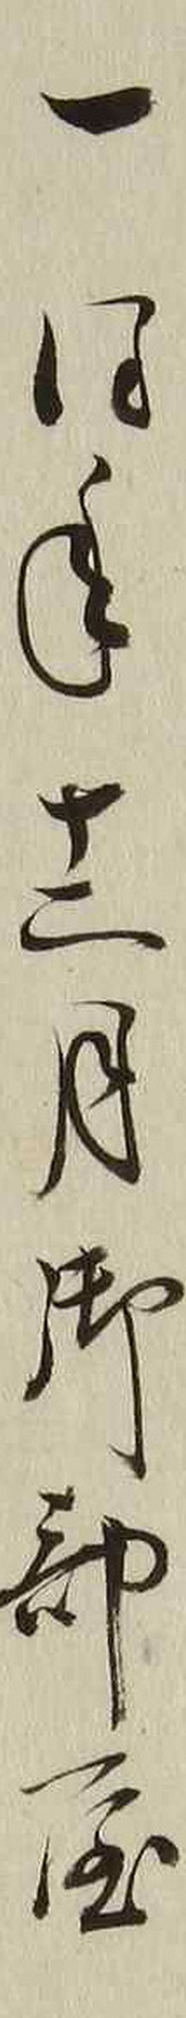一同年十二月御部屋
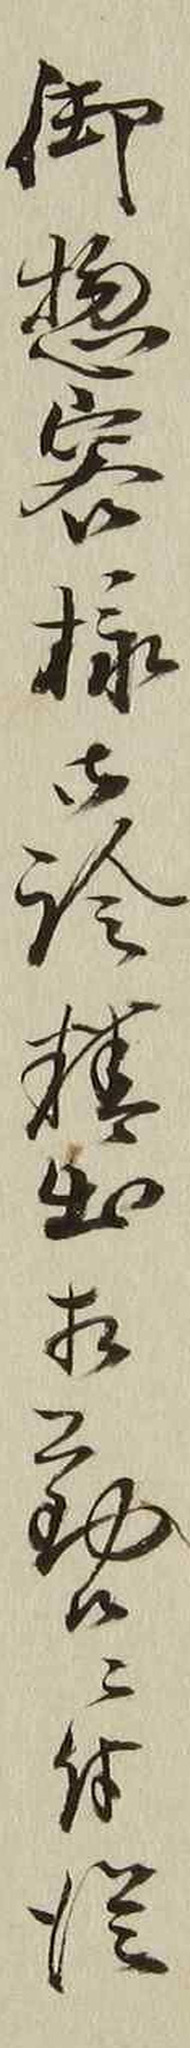御惣容様御診精出相勤候に付従
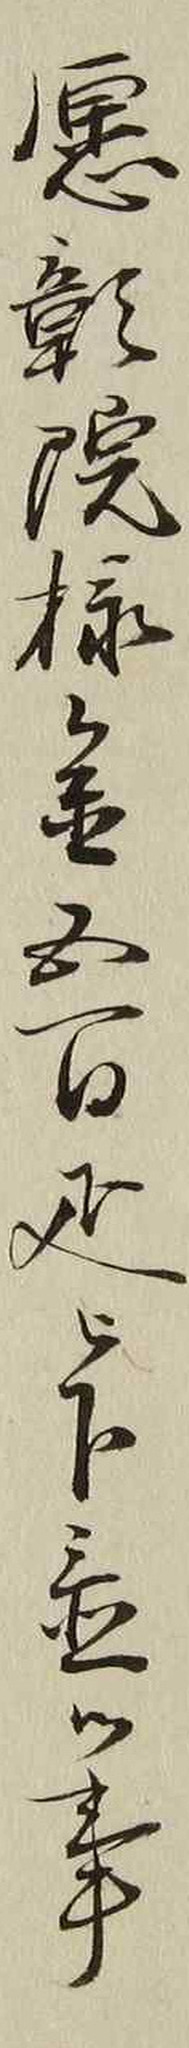愿彰院様金五百疋被下置候事
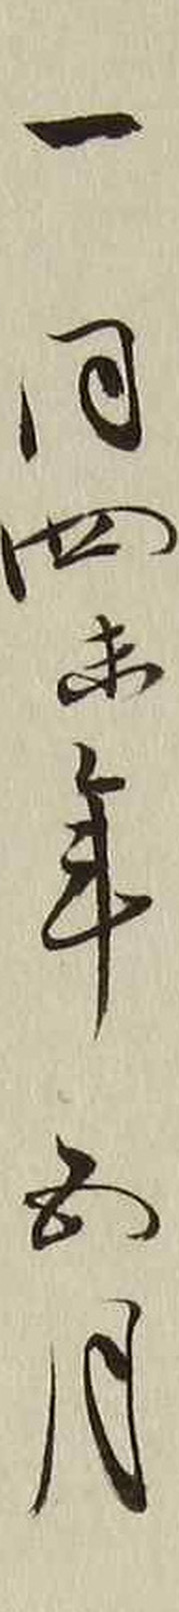一同四未年五月
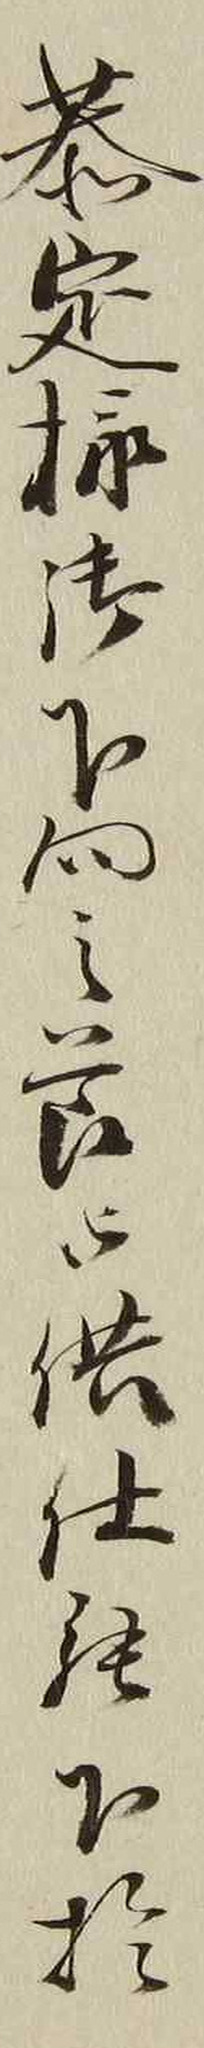恭定様御下向之節御供仕罷下於
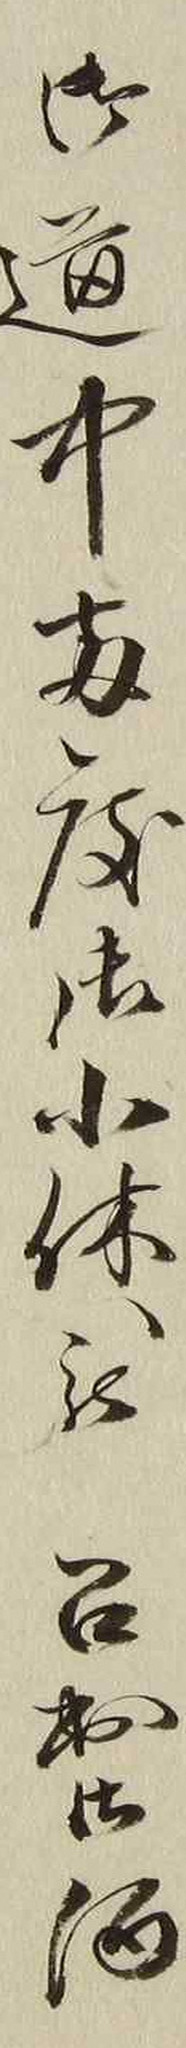御道中両度御小休へ被召出御酒
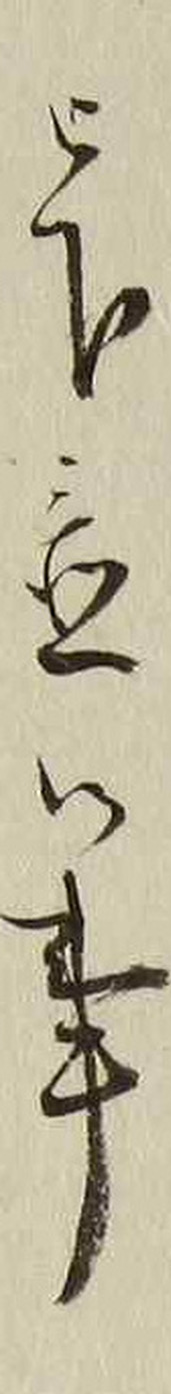被下置候事
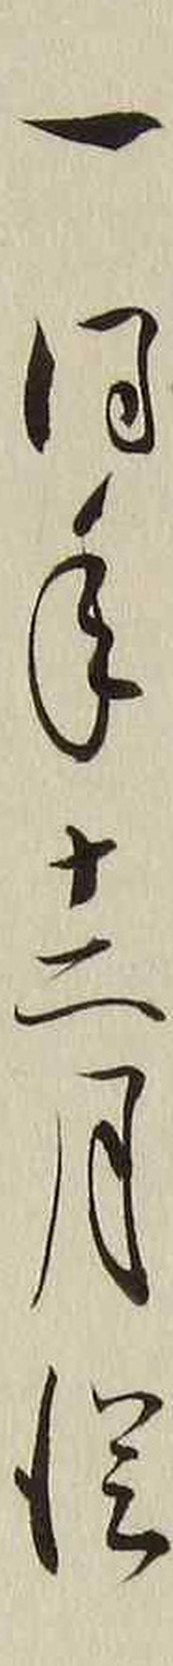一同年十二月従
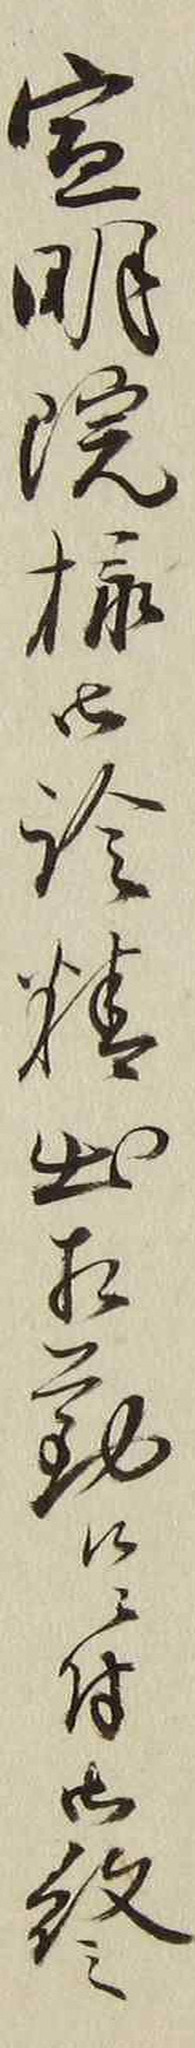宣明院様御診精出相勤候に付御紋之
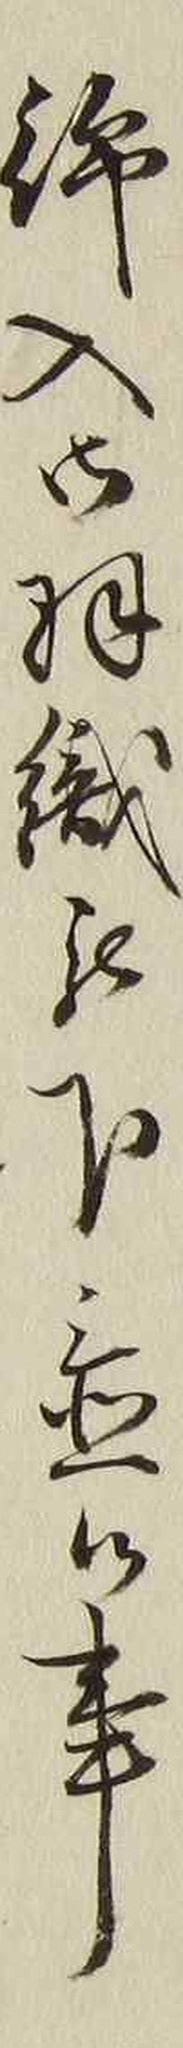綿入御羽織被下置候事
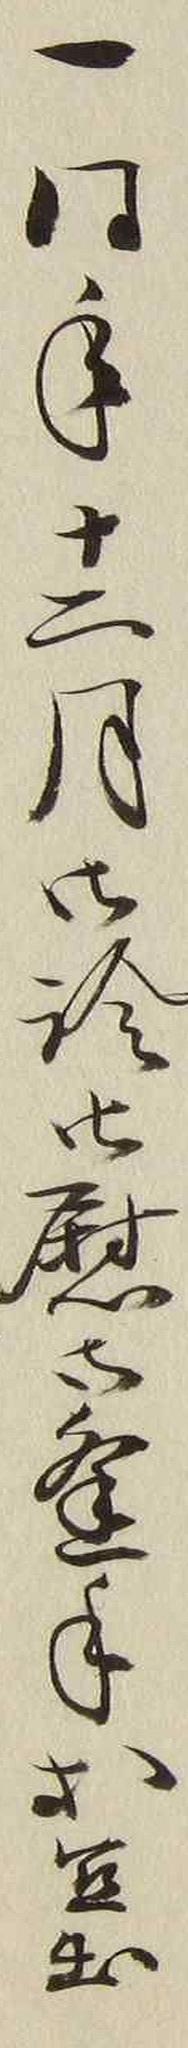一同年十二月御診御慰御逢手等宜出
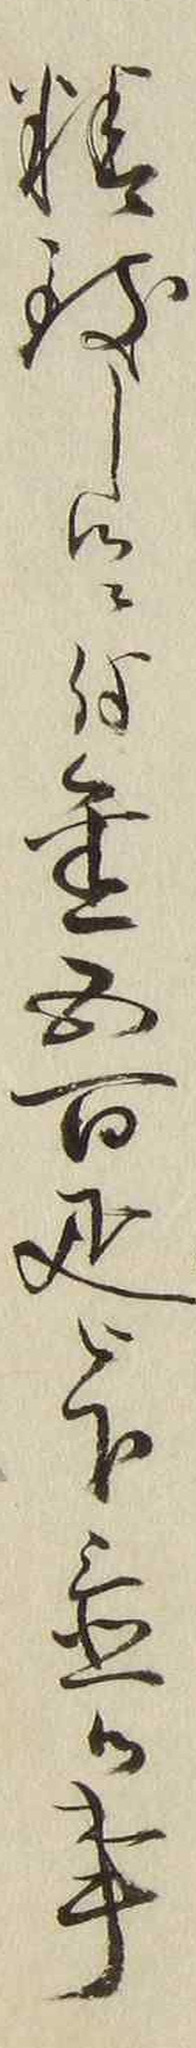精致し候に付金五百疋被下置候事

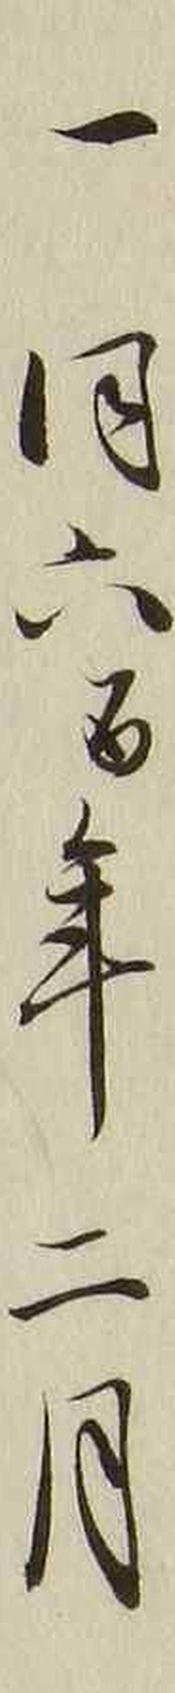一同六酉年二月
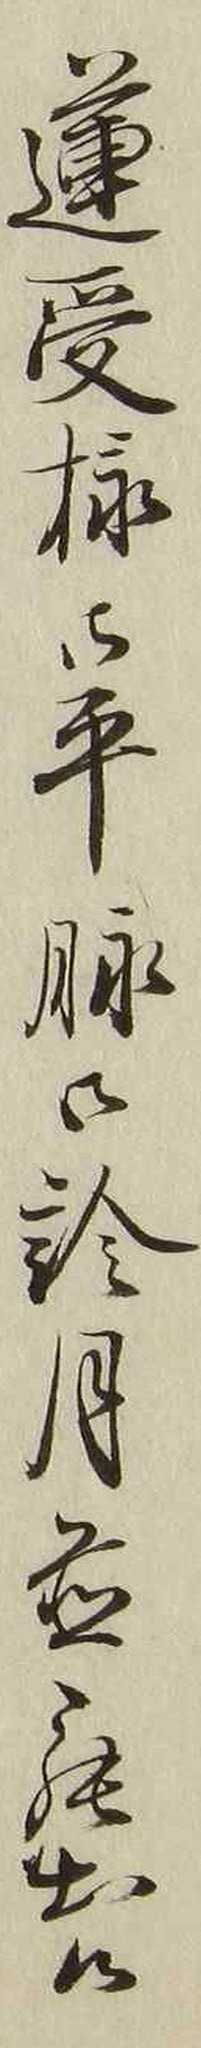蓮受様御平脈御診月並罷出候
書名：諸士系譜　巻之157　ね之部1
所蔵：会津若松市立会津図書館
